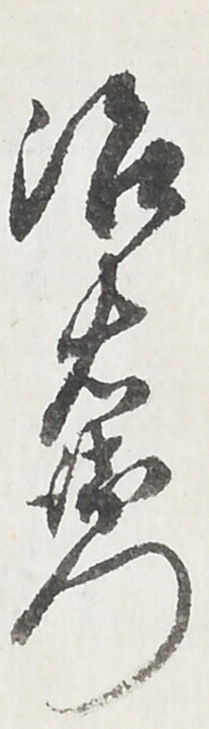政右衛門
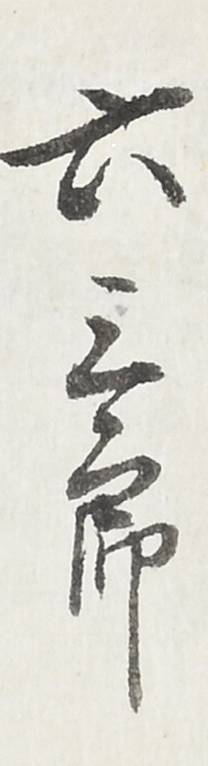六三郎
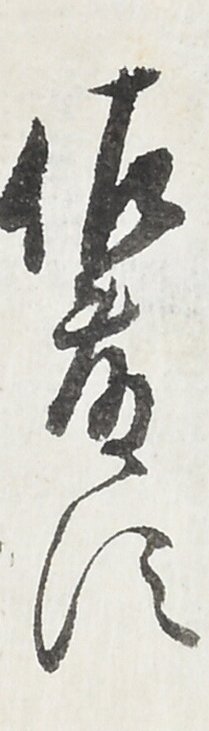佐藤次
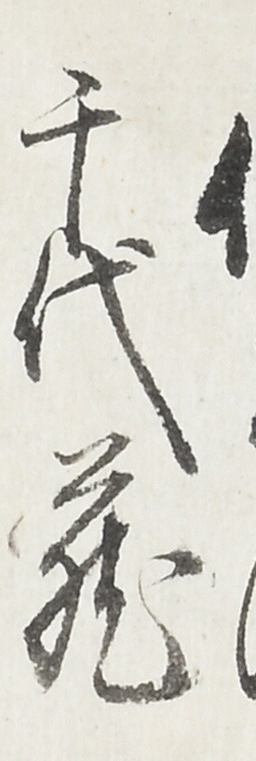千代蔵

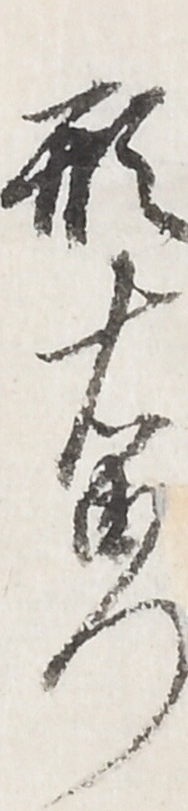形右衛門
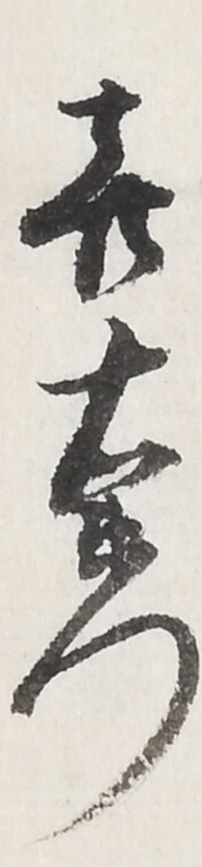喜右衛門
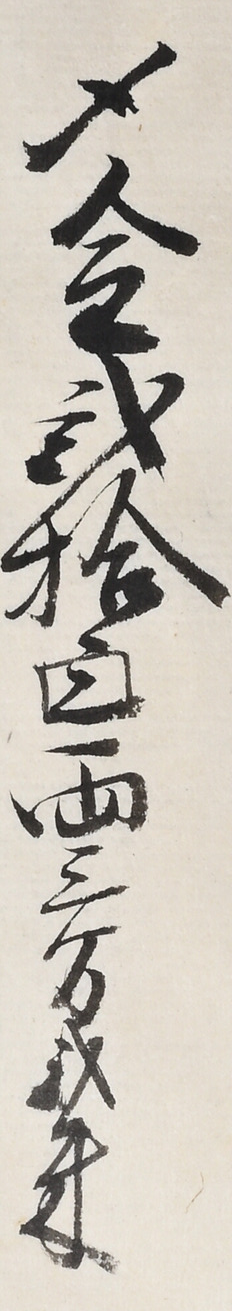〆金弐拾三両三分弐朱
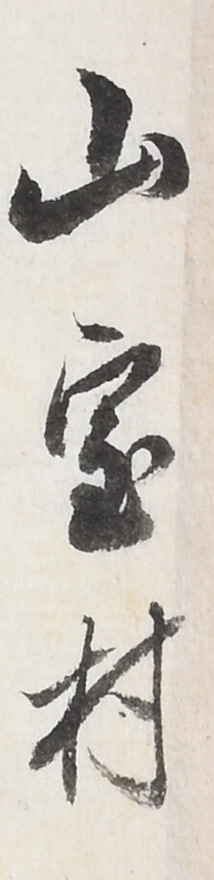山室村
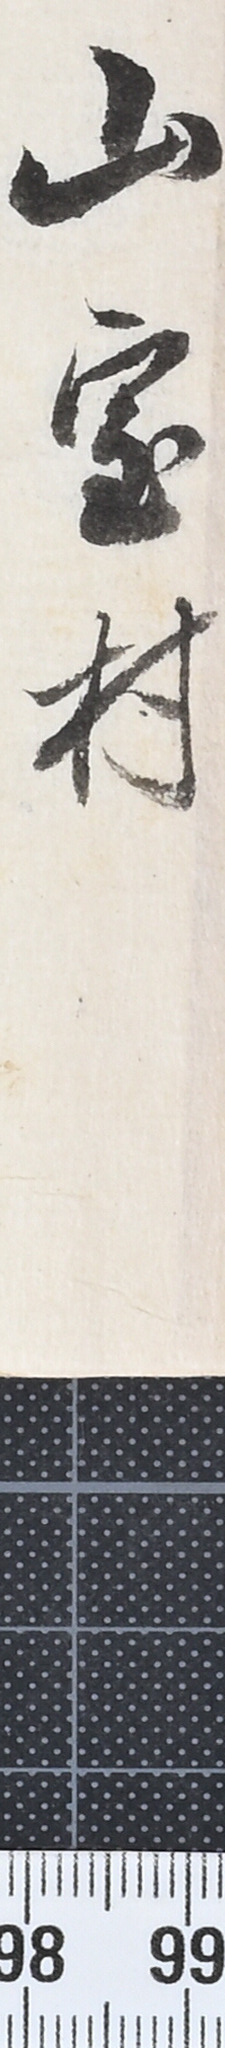山室村
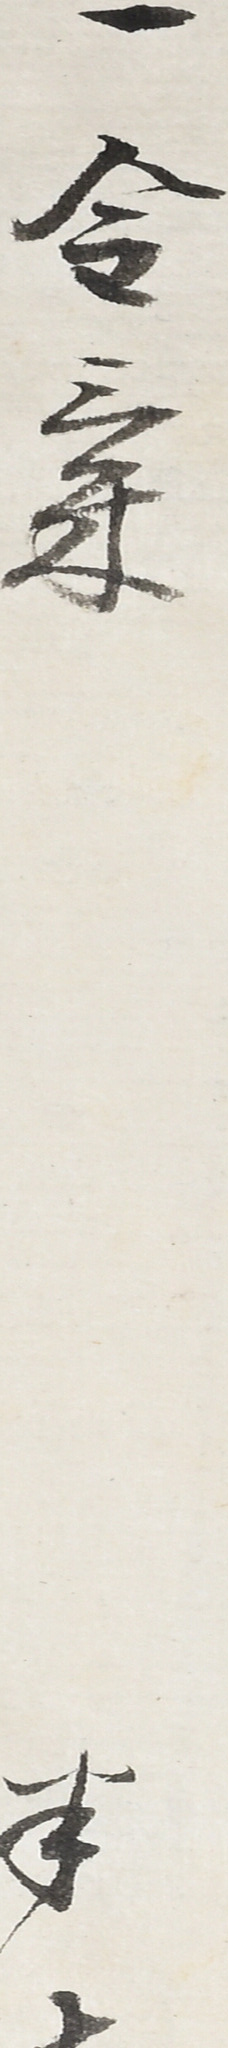一金参朱半十
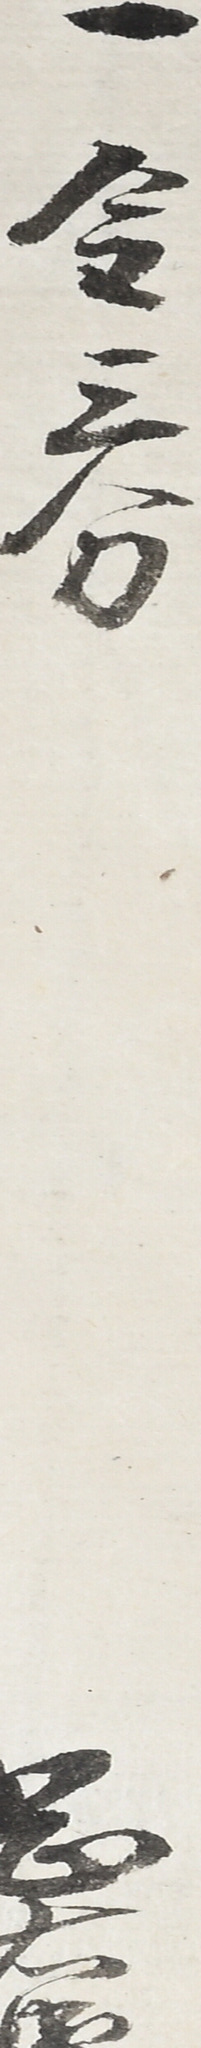一金三分岡右衛門
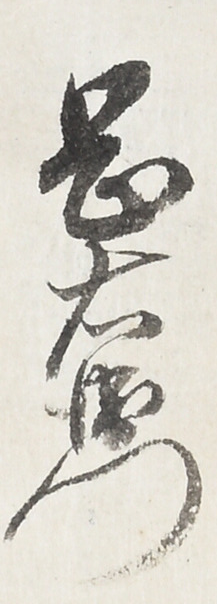形右衛門
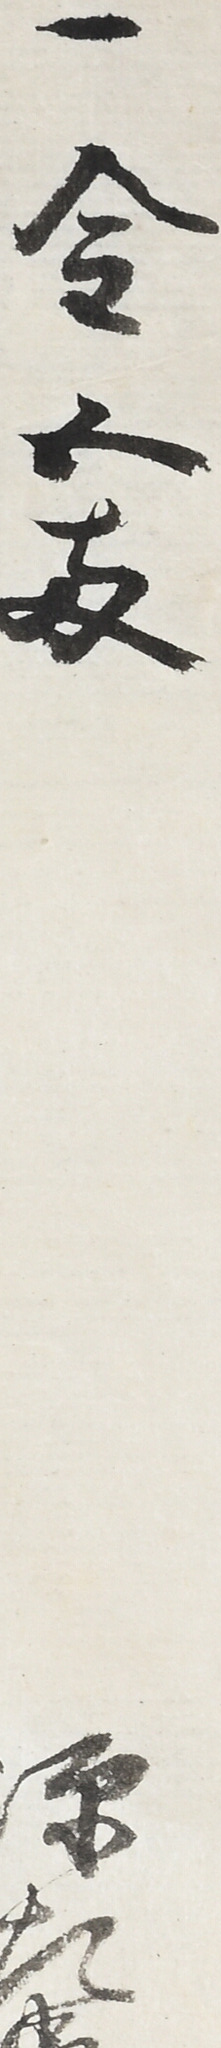一金五両源左衛門

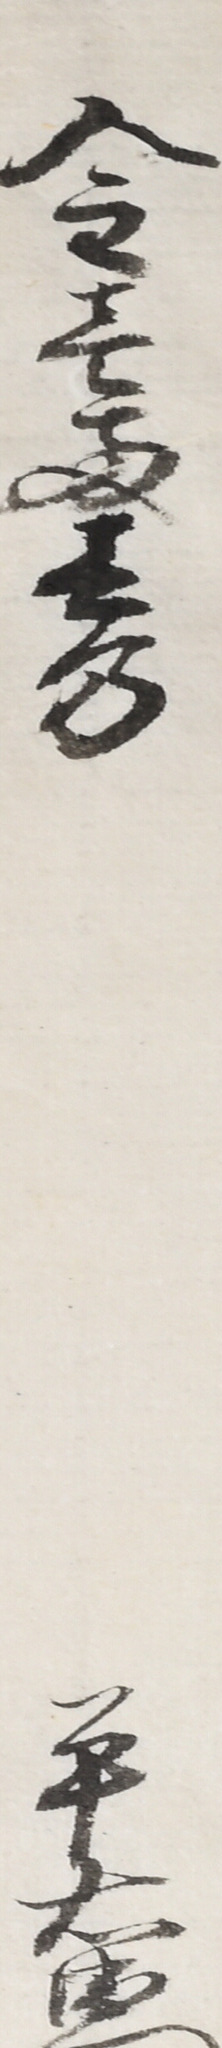一金壱両壱分平右衛門
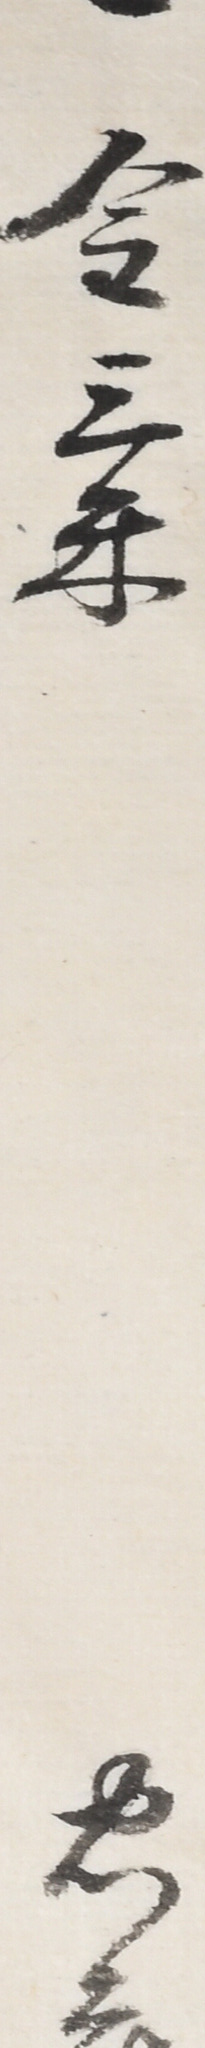一金三朱忠蔵
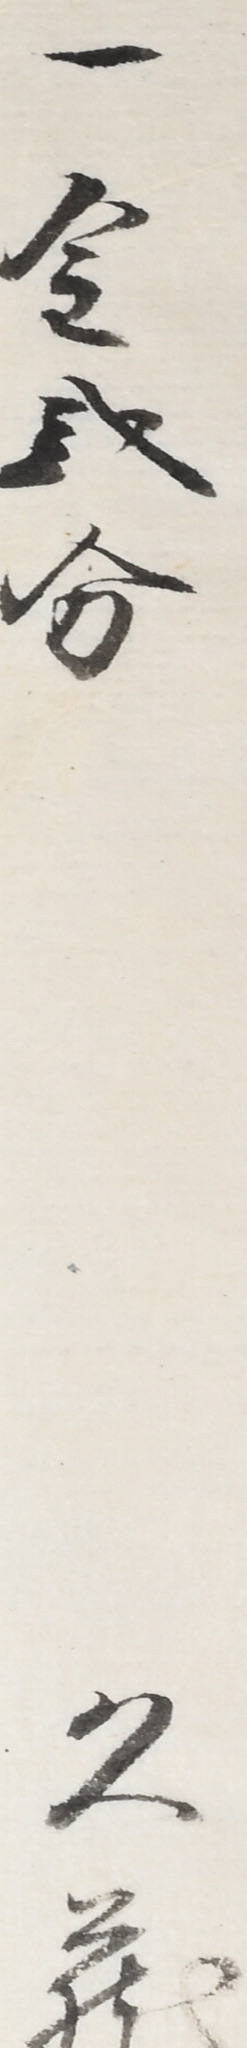一金弐分久蔵
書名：御拝地百五拾年御祝儀献上御目録名前
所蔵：伊那市立高遠町図書館・合同会社AMANE
